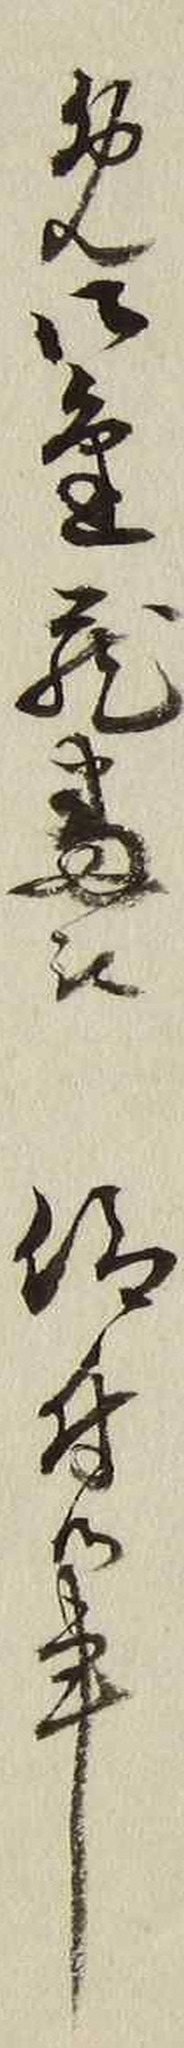免御金蔵番被仰付候事
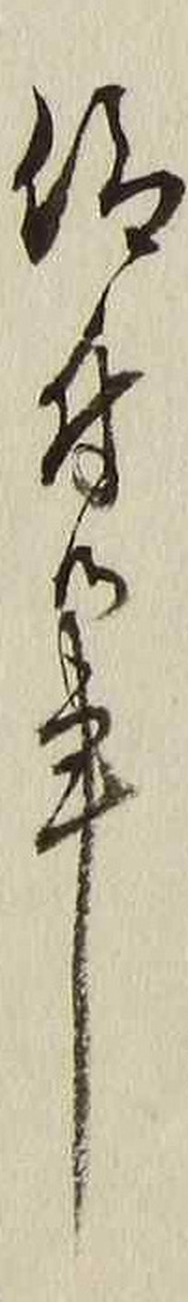仰付候事
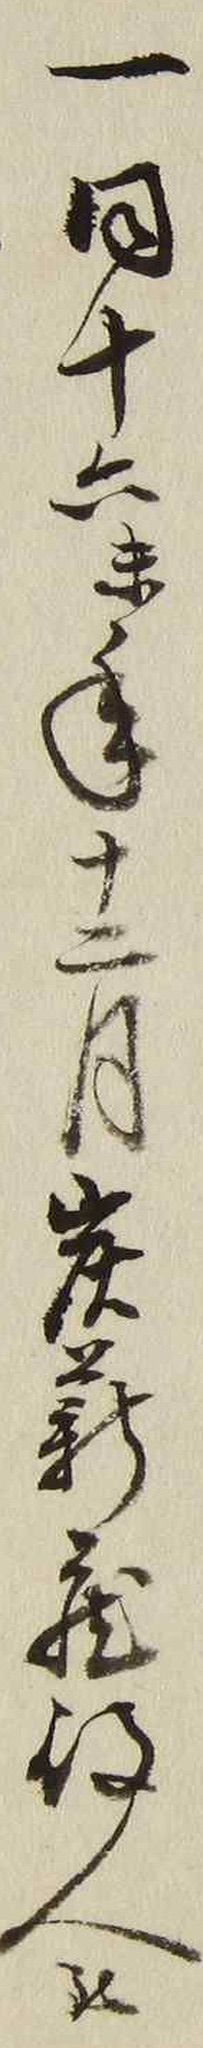一同十六未年十二月炭薪蔵役人被
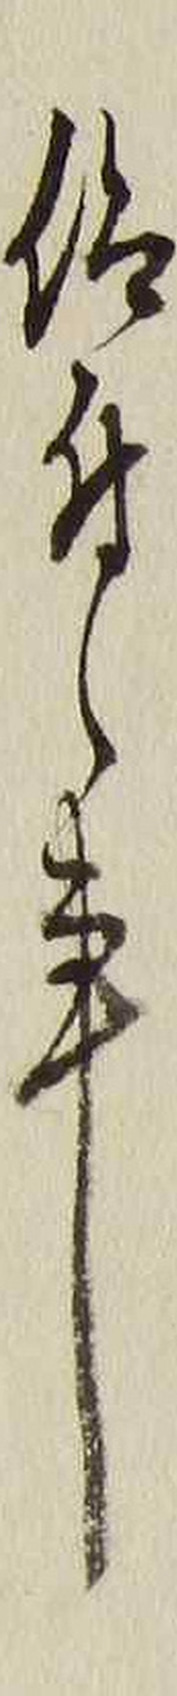仰付候事
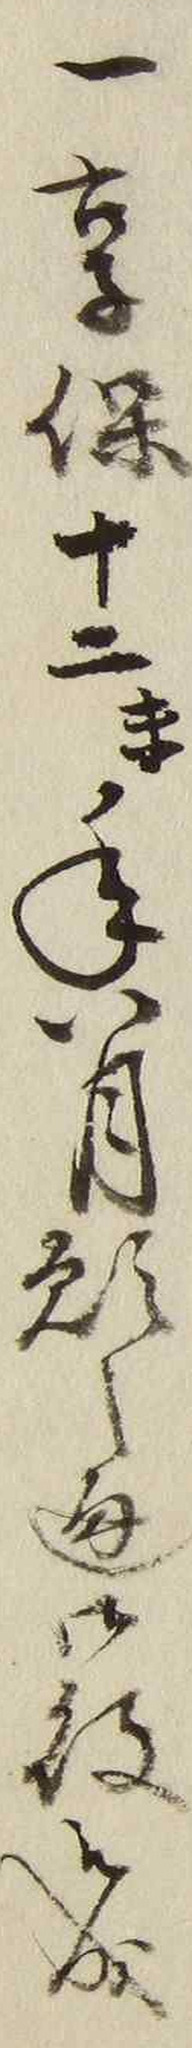一享保十二未年月八願之通御役被成

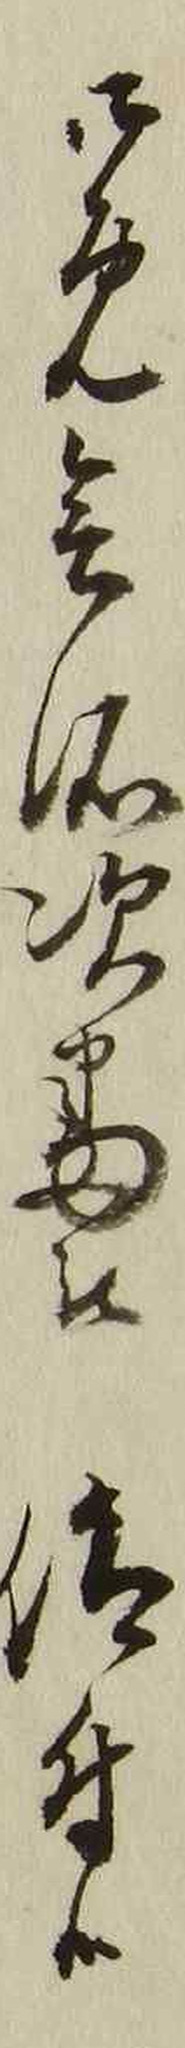御免会所次番被仰付候
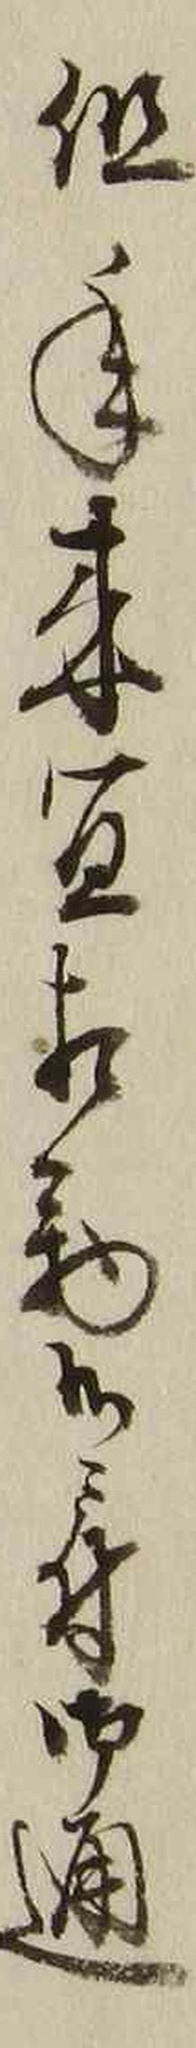但手来宜相勤候ニ付御通
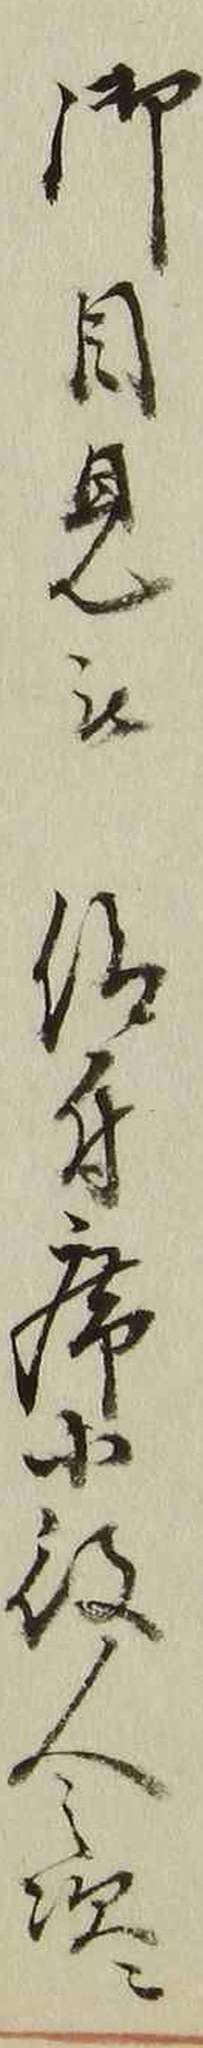御目見被仰付席小役人之次ニ
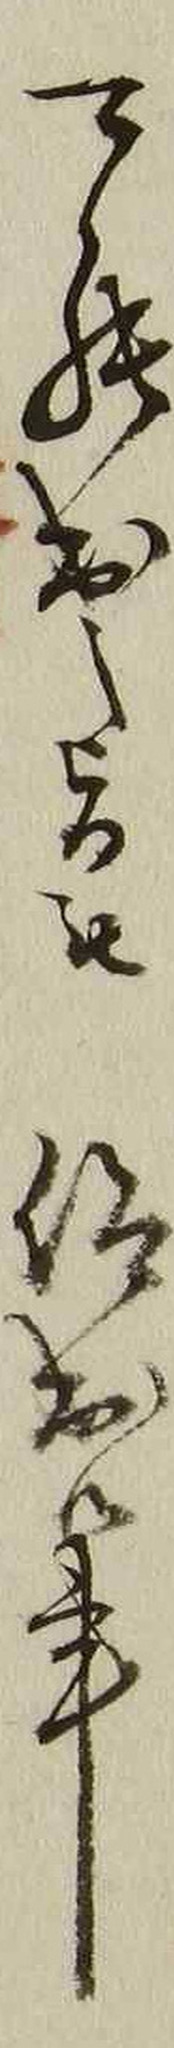可罷出之旨被仰出候事
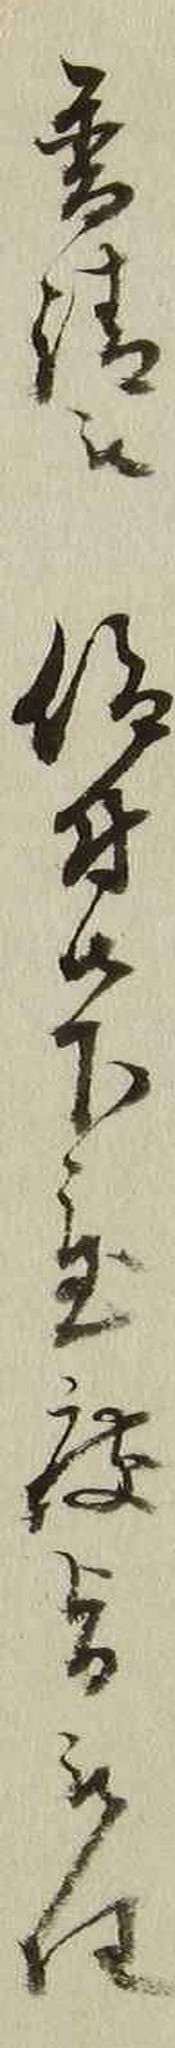普請被仰付被下置度旨被任
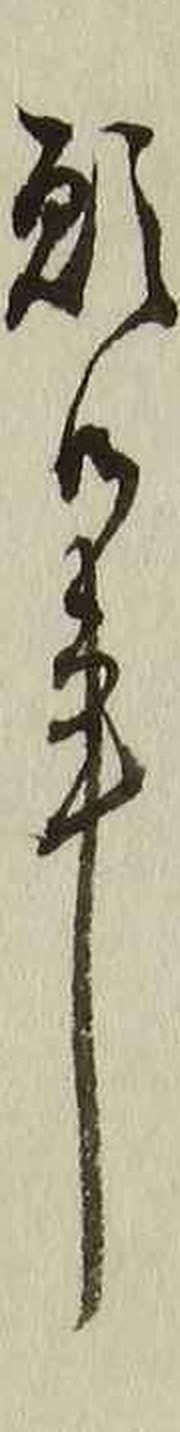願候事
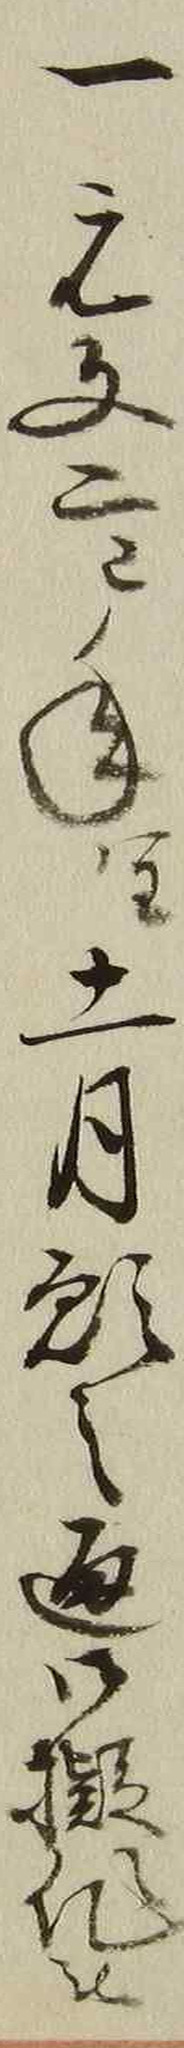一元文二巳年閏十一月願之通御擬作被
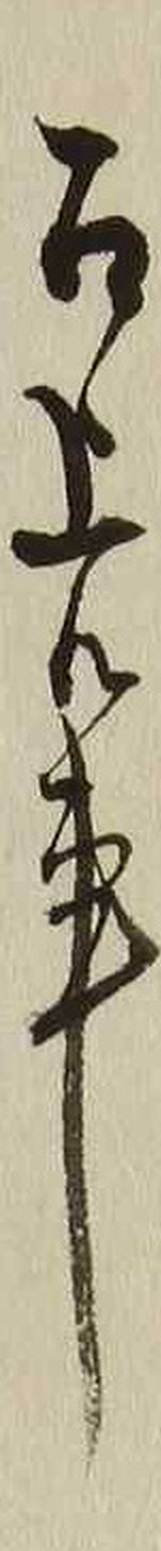召上候事
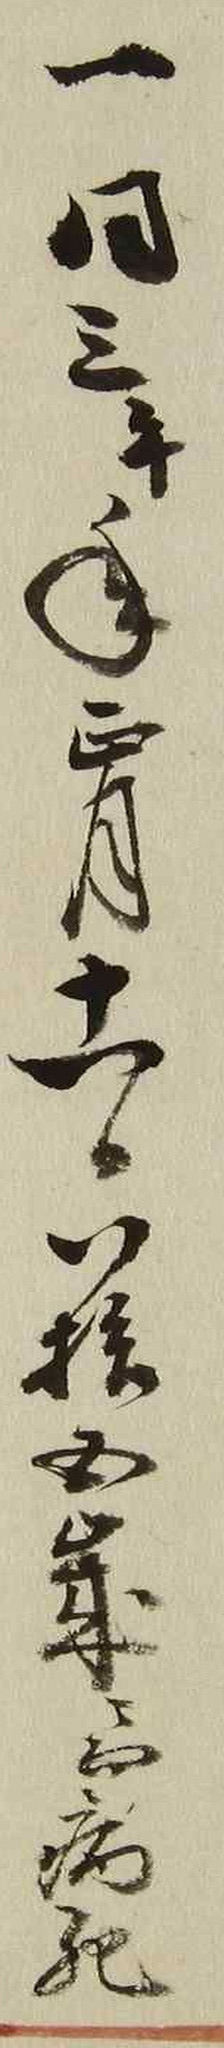一同三午年正月十一日八拾五歳ニ而病死
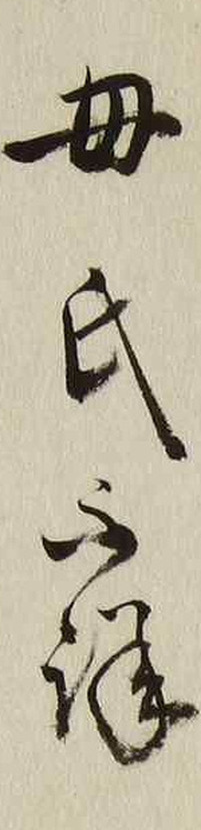母氏不詳
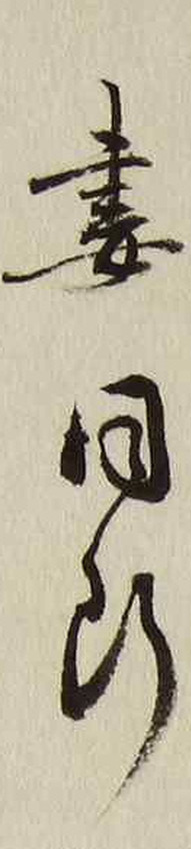妻同断
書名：諸士系譜　巻之36　は之部4
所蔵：会津若松市立会津図書館
